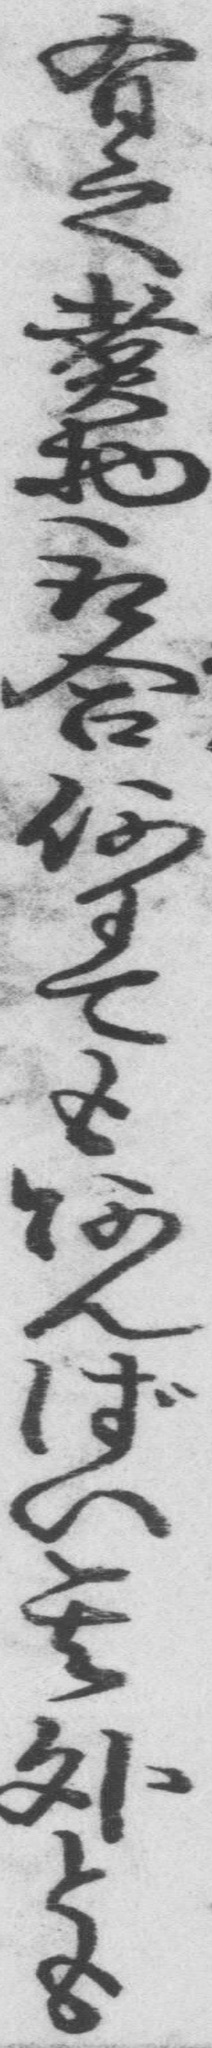有之煮物取合何尓ても阿んばい其外とも
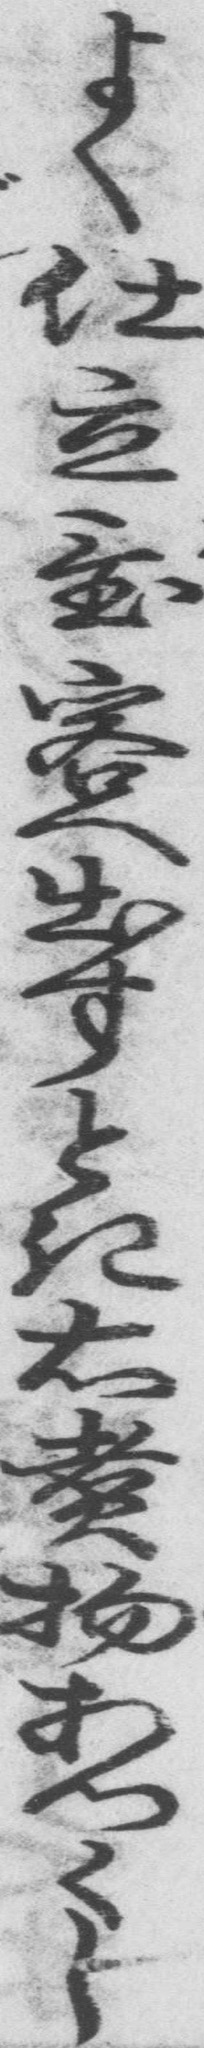よく仕立置客へ出すと起右煮物あつくし
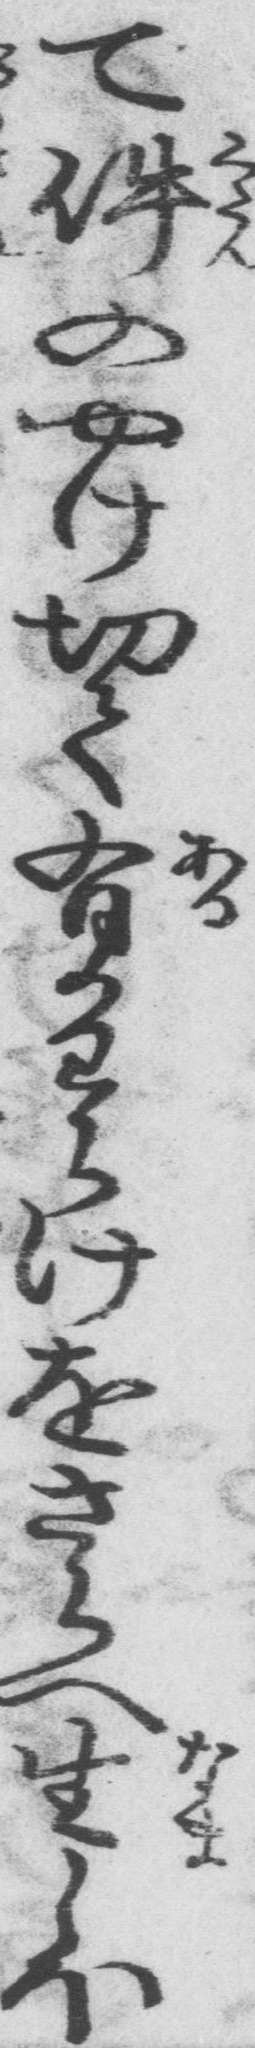て件のやけ切て有かわらけをさらへ生し不
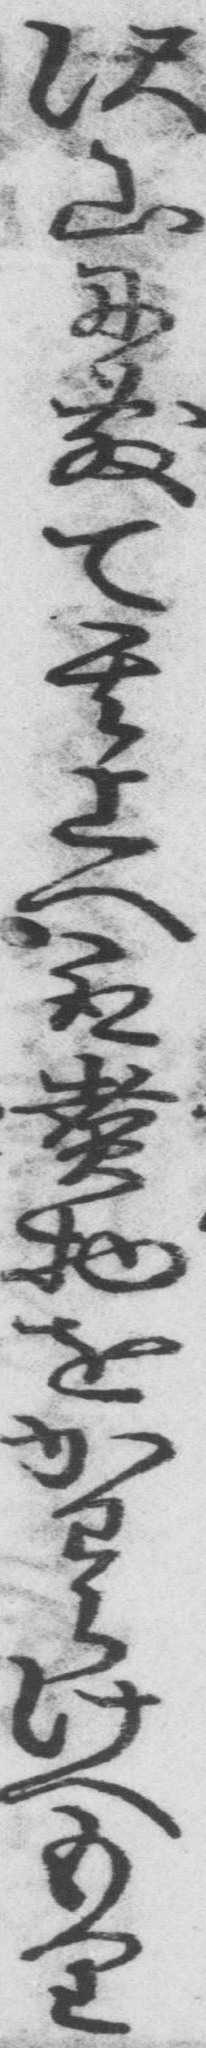沢山丹敷て其上へ取煮物をかわらけへも里
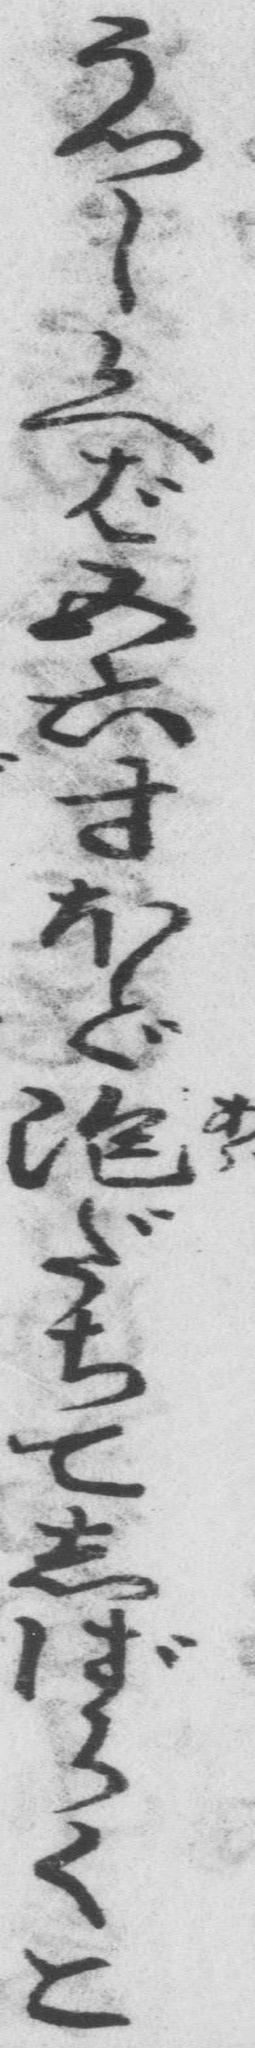うつし候へば五六寸不ど泡だちて志ばらくこ
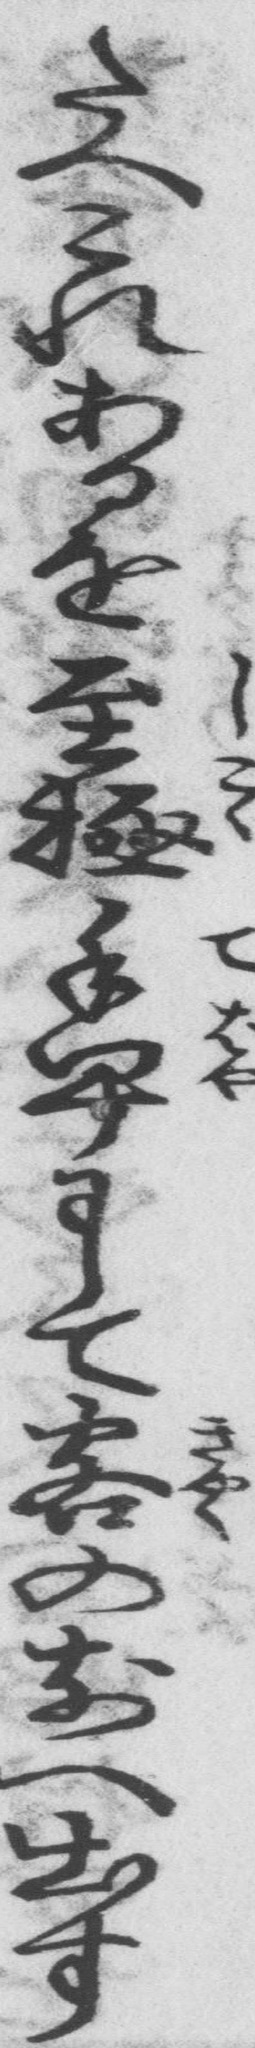たへこれあるを至極手早尓て客の前へ出す
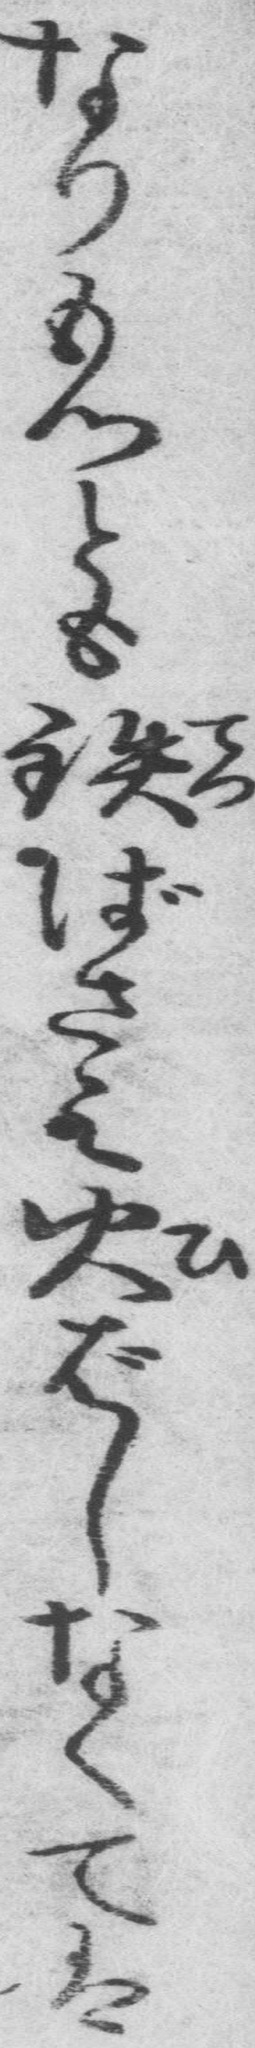なりもつとも鉄ばさみ火ばしなくて盤
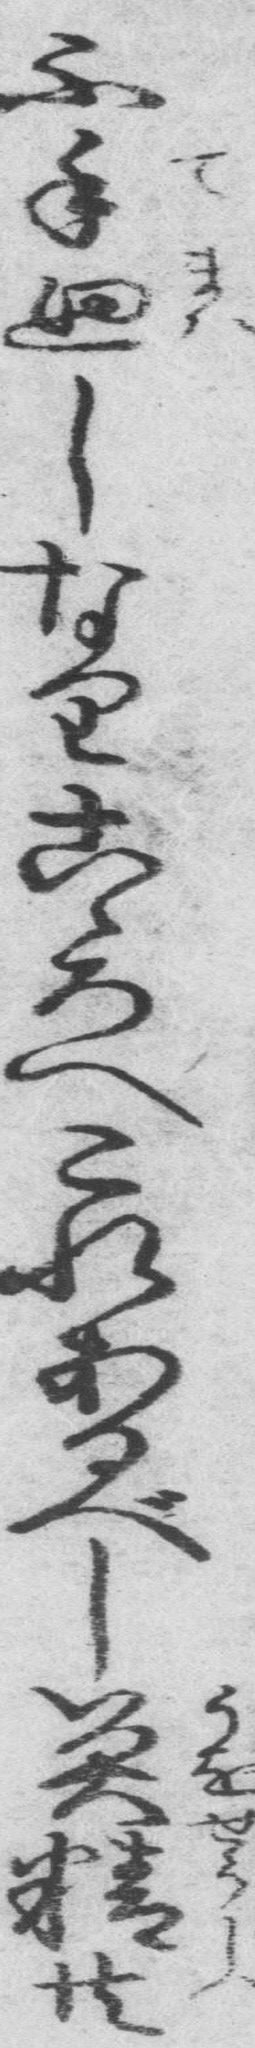ふ手廻しな里古々ろへこれあるべし魚精共
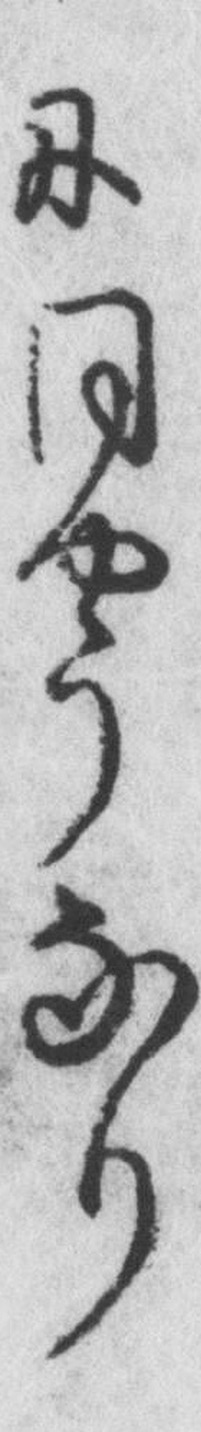丹同やうなり
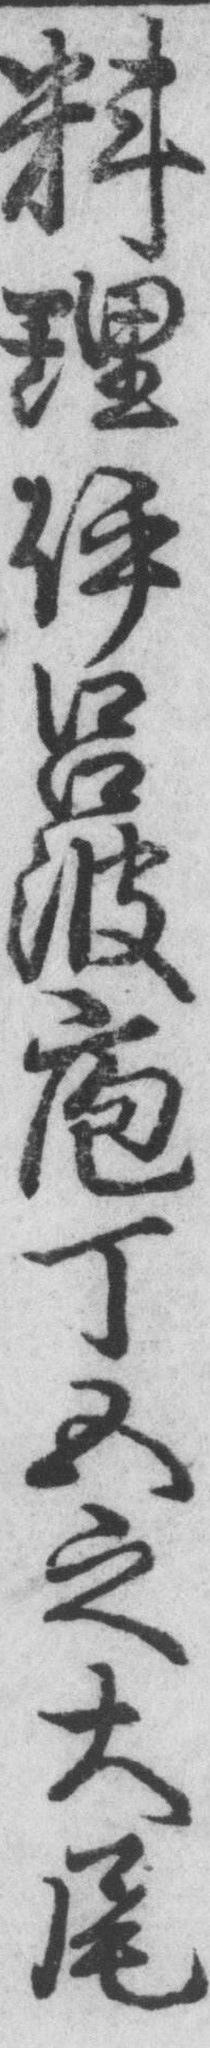料理伊呂波庖丁五之大尾

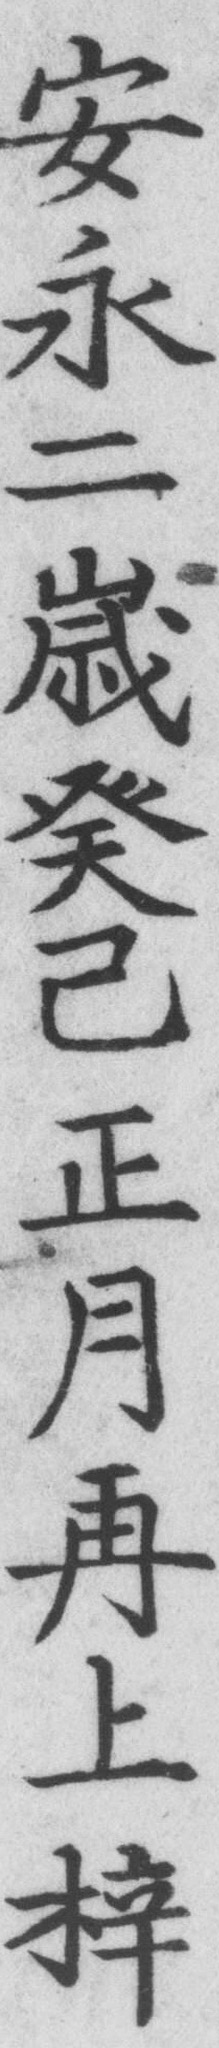安永二歳癸巳正月再上梓
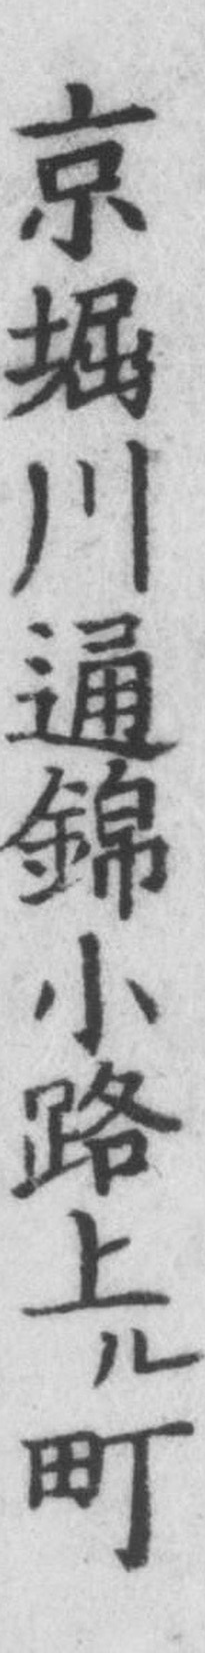京堀川通錦小路上ㇽ町
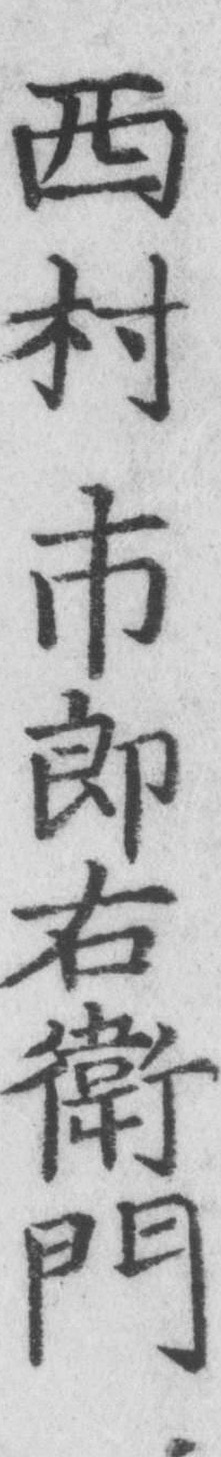西村市郎右衛門
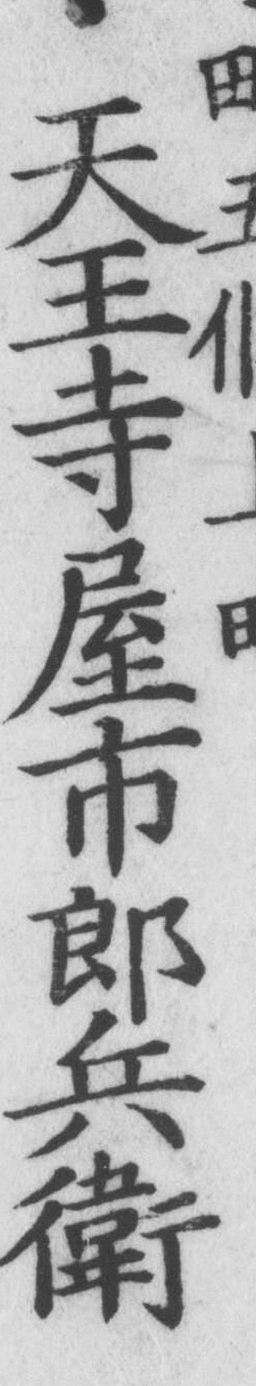天王寺屋市郎兵衛
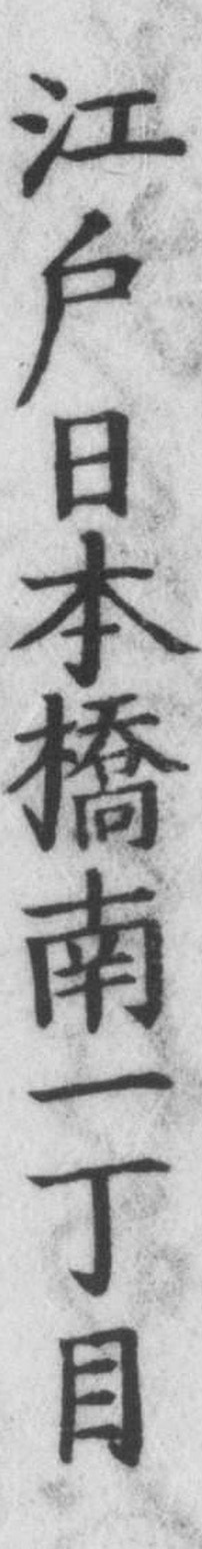江戸日本橋南一丁目
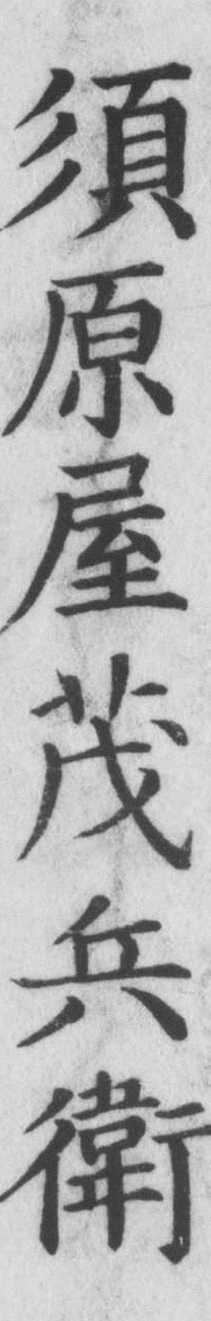須原茂兵衛
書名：料理伊呂波庖丁
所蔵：大阪府立大学学術情報センター 国文学研究資料館
